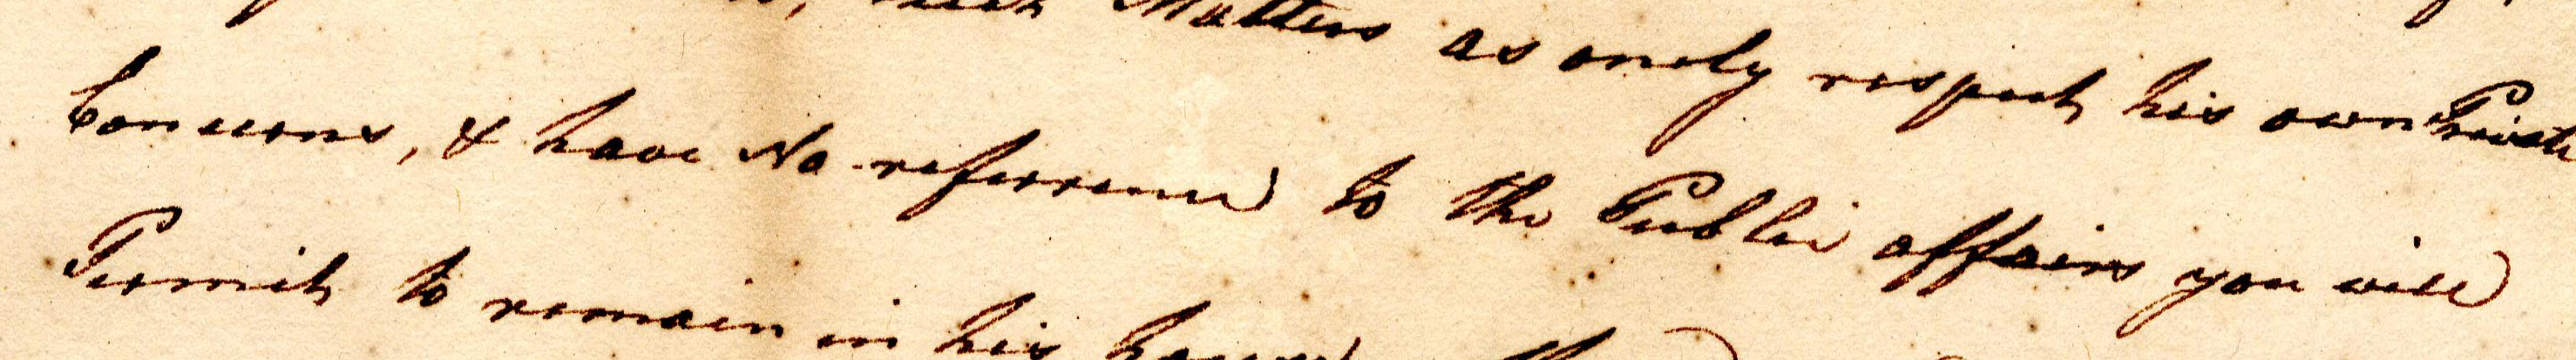Concerns, & have no referrence to the Public affairs you will
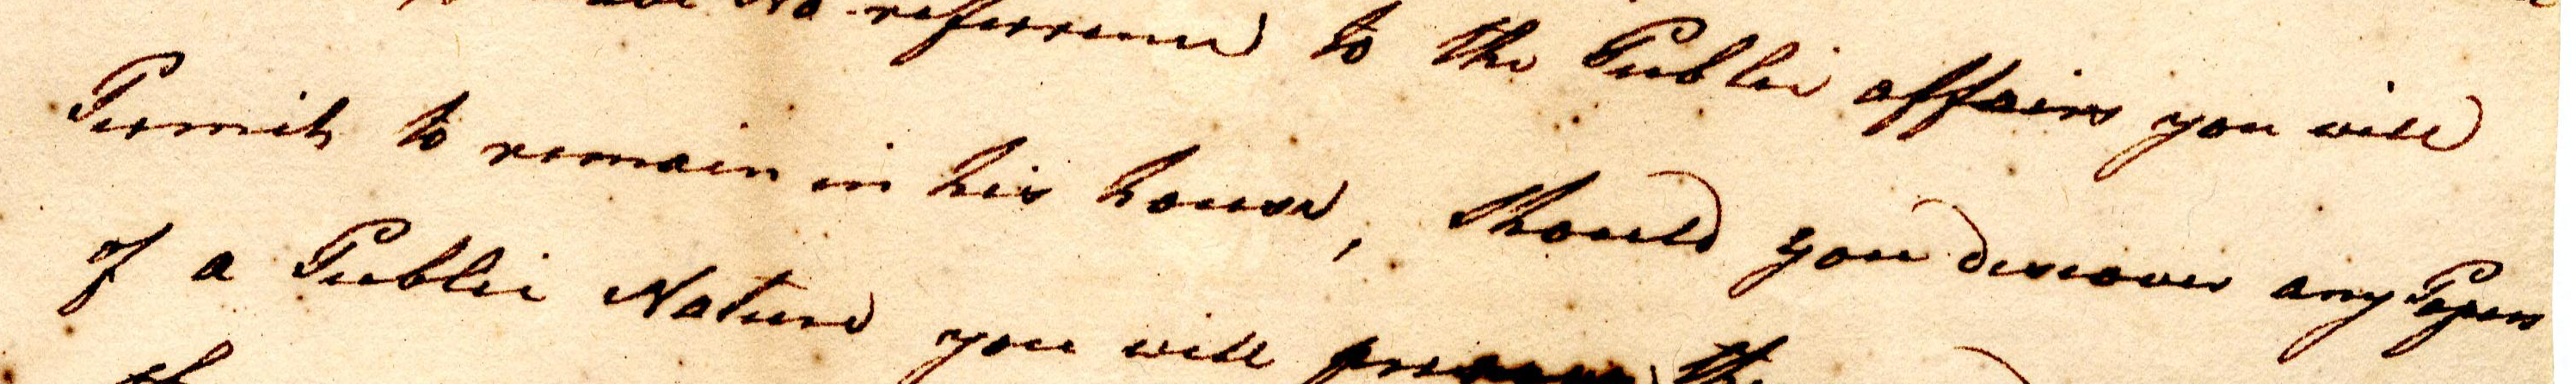Permit to remain in his house, Should you discover any Papers
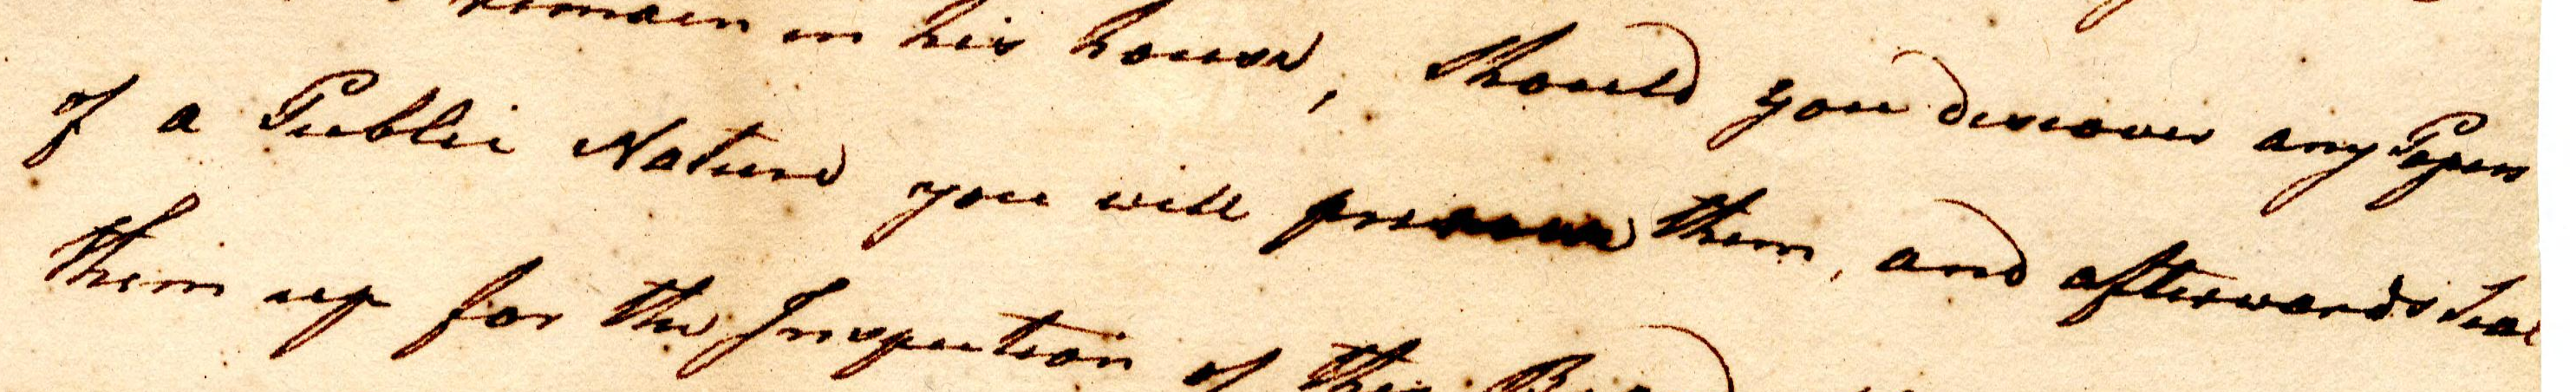of a Public Nature you will procure them, and afterwards seal
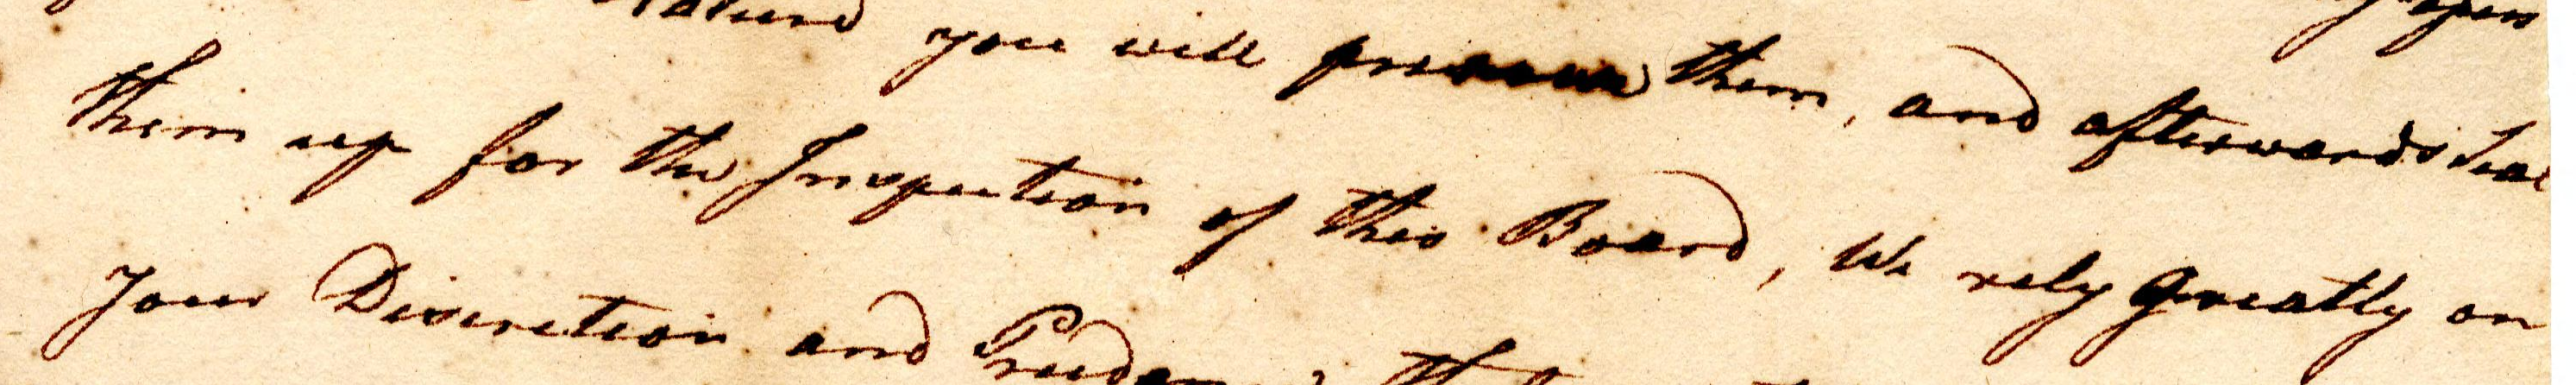them up for the Inspection of the Board. We rely greatly on
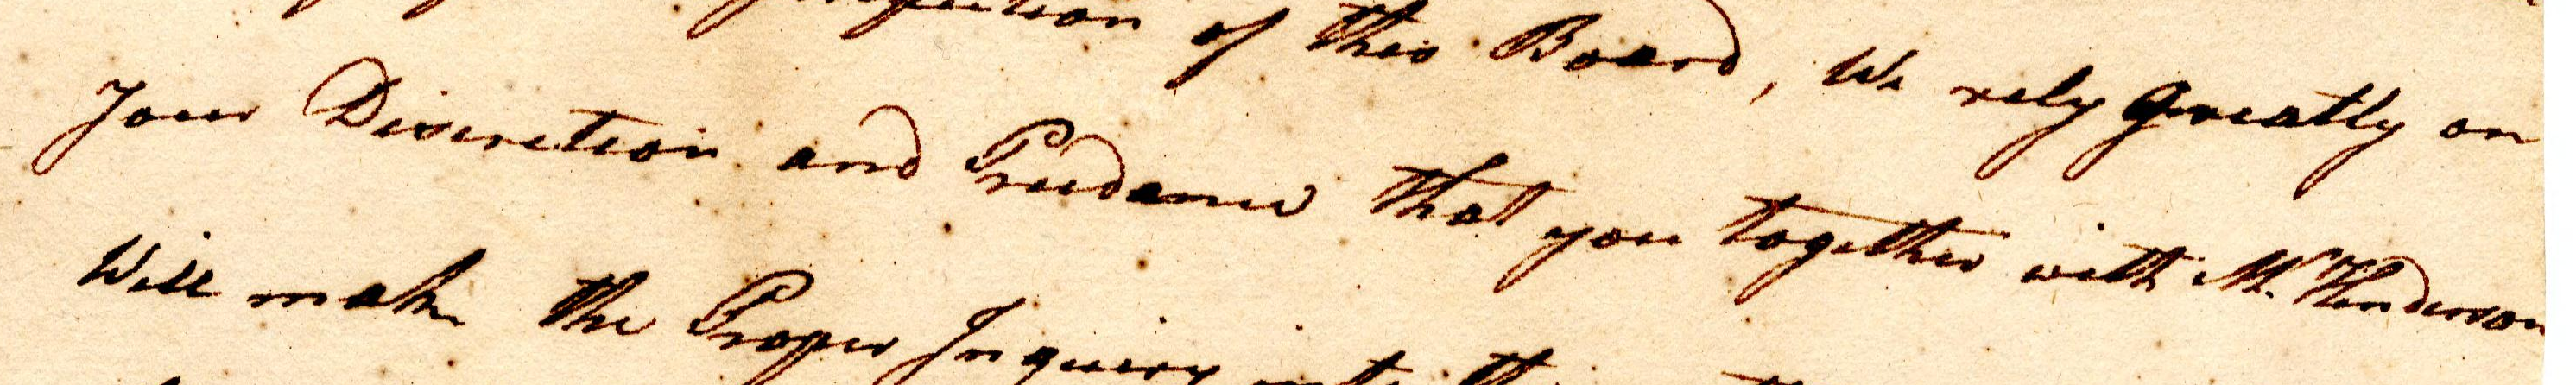Your Discretion and Prudence that you together with M^r. Henderson
